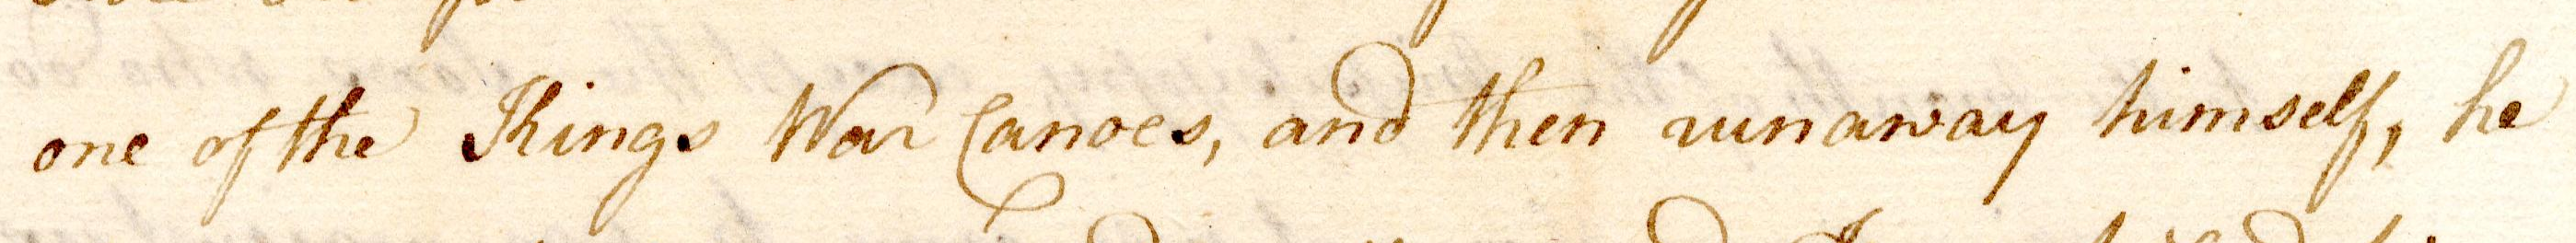one of the Kings War Canoes, and then ran away himself, he
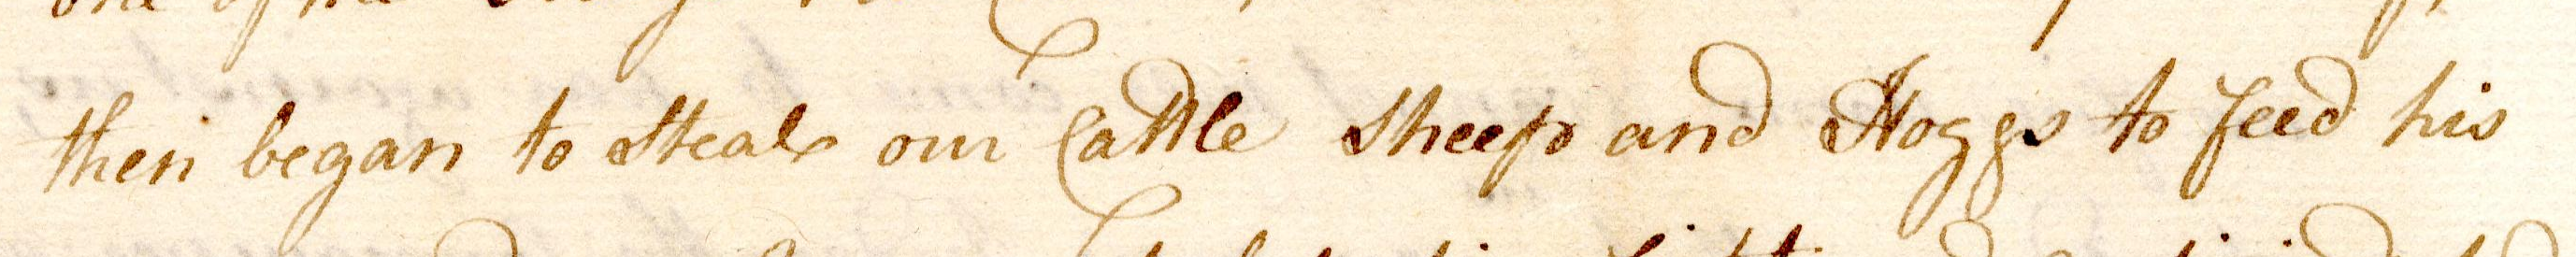then began to Steal our Cattle Sheep and Hoggs to feed his
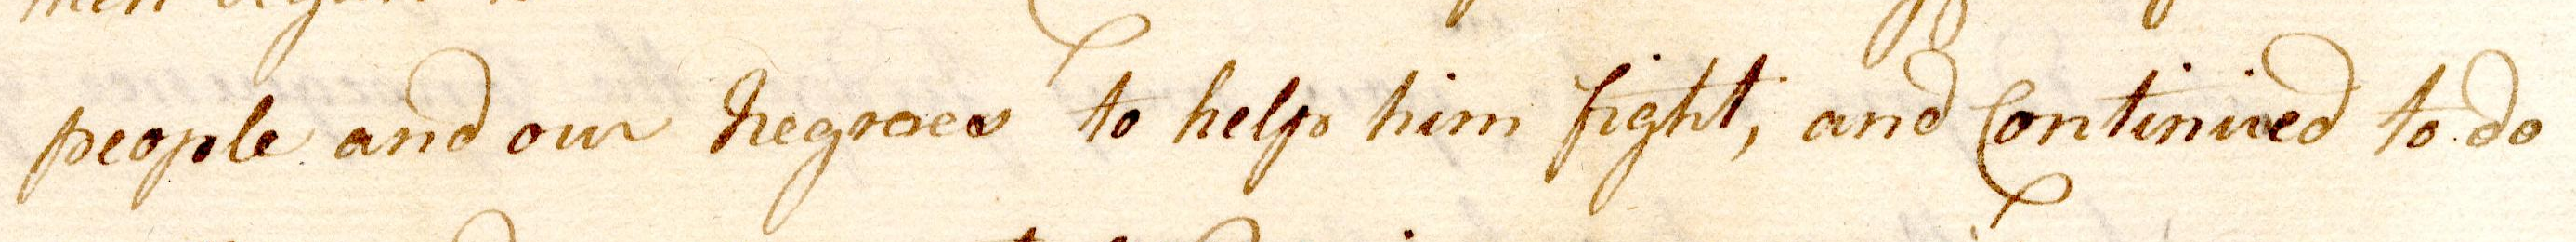people and our Negroes to help him fight, and Continued to do
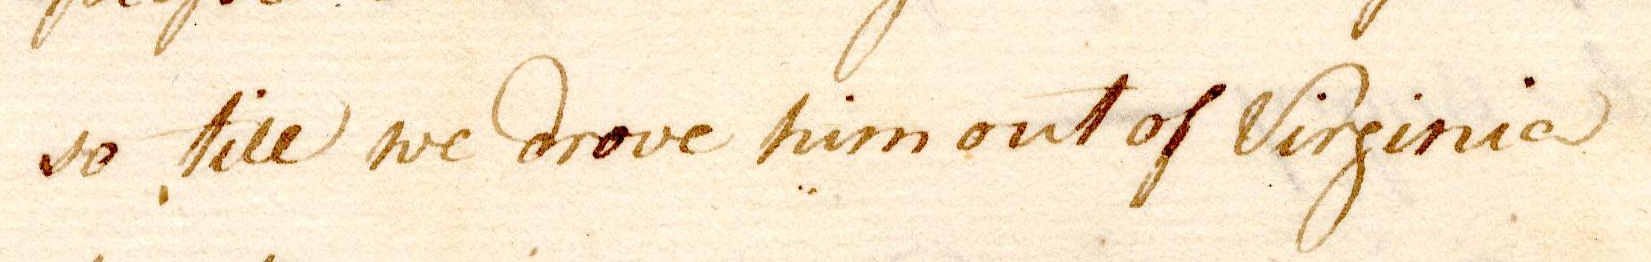so till we drove him out of Virginia
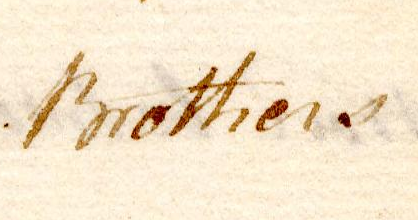Brothers
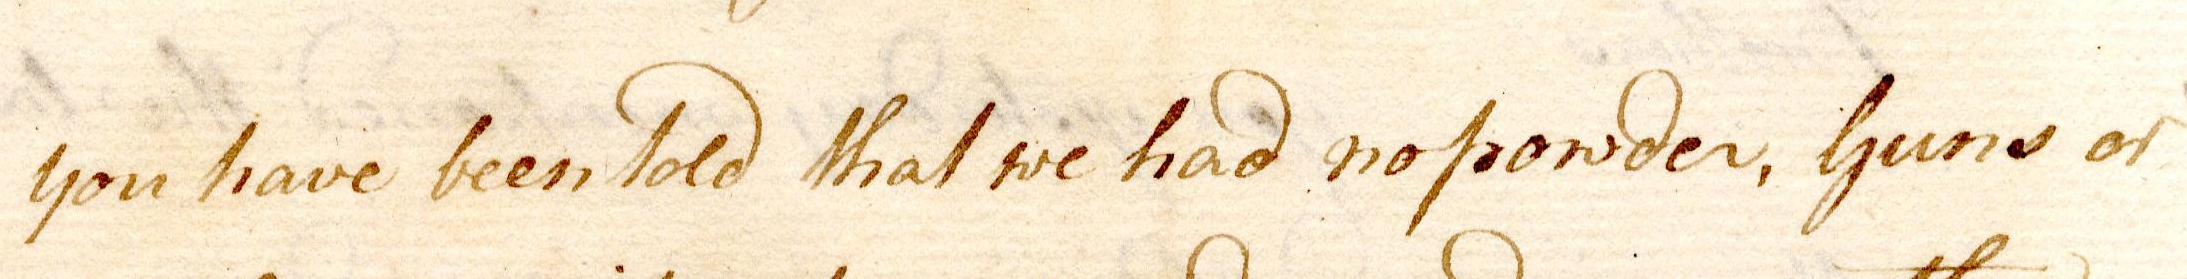You have been told that we had no powder, Guns or
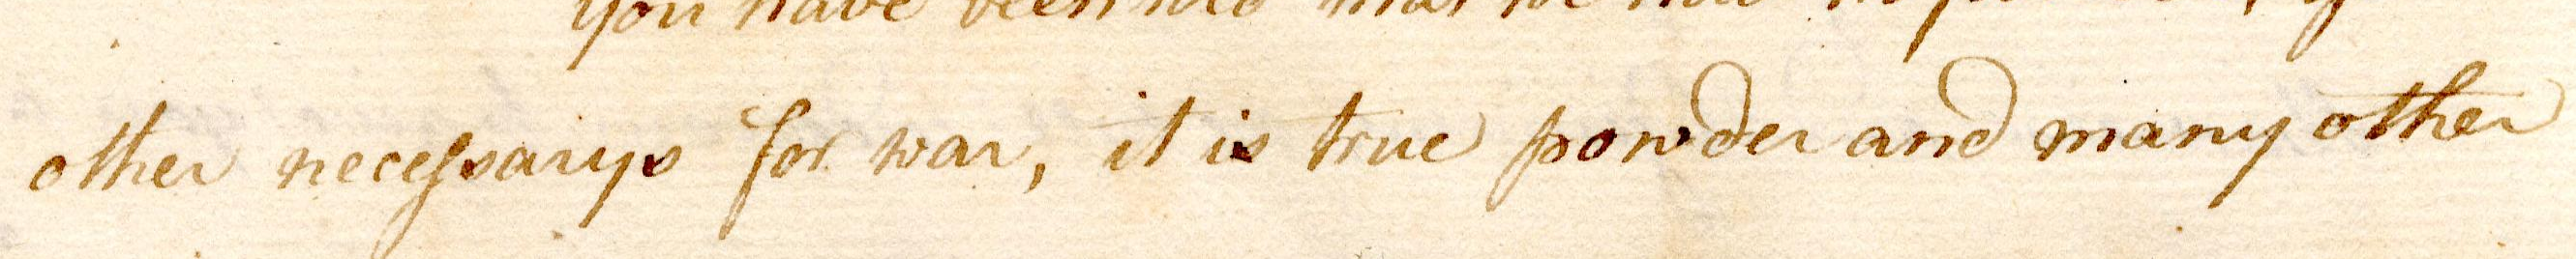other necessarys for war, it is true powder and many other
